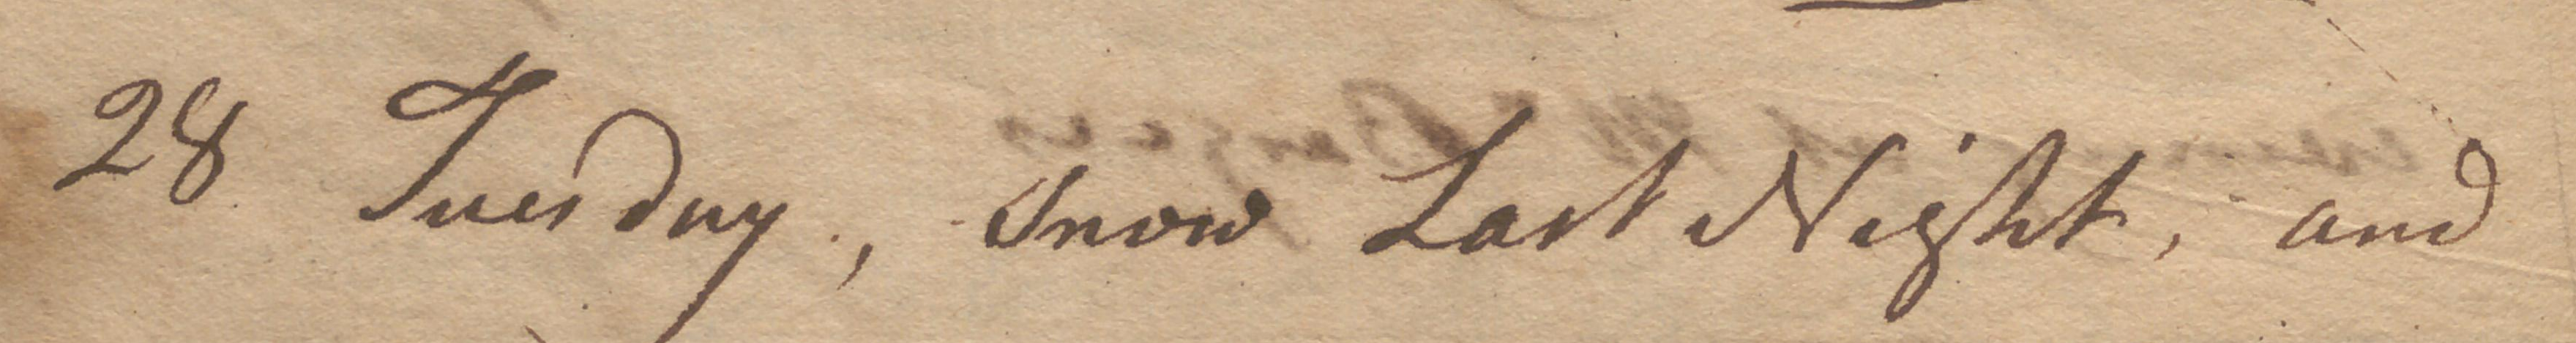28 Tuesday, snow Last Night, and
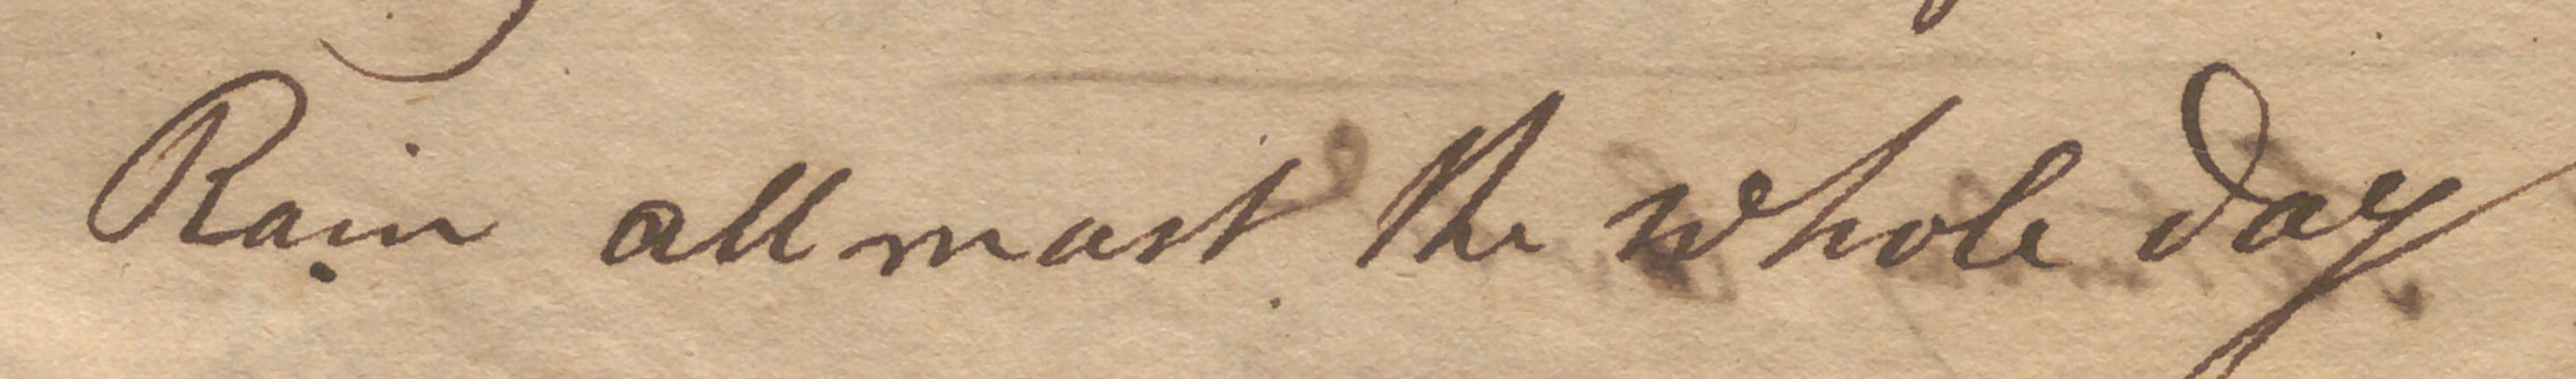Rain all most the whole day
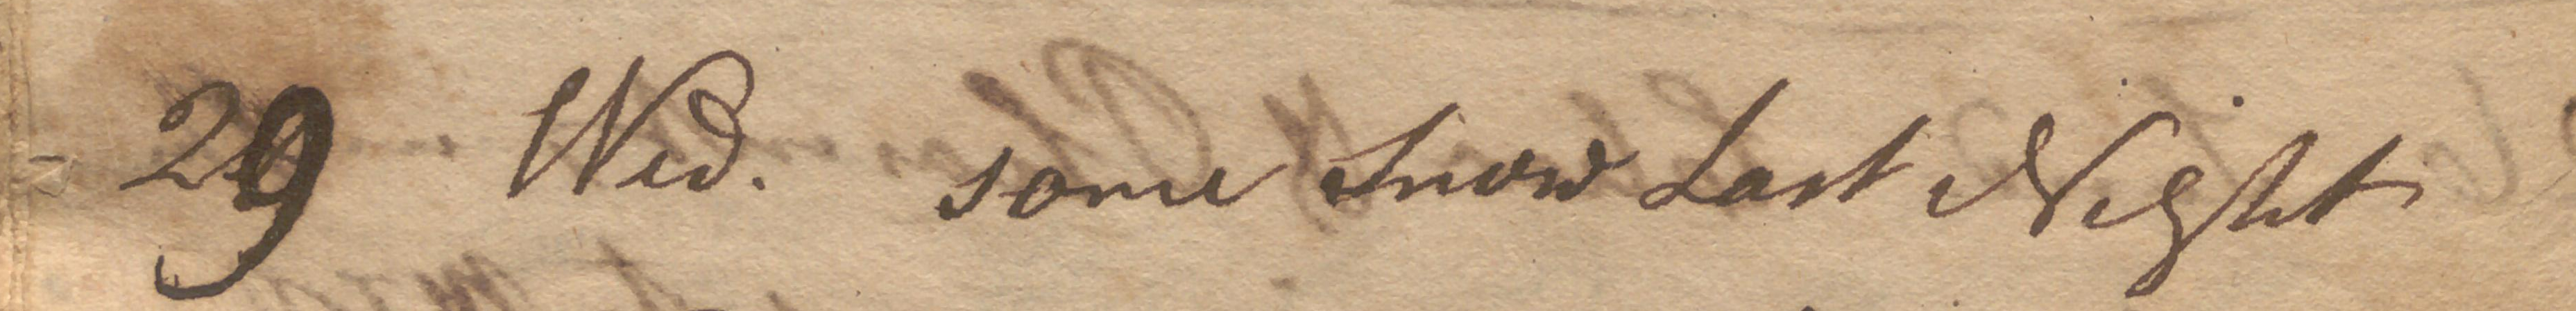29 Wed. some snow Last Night
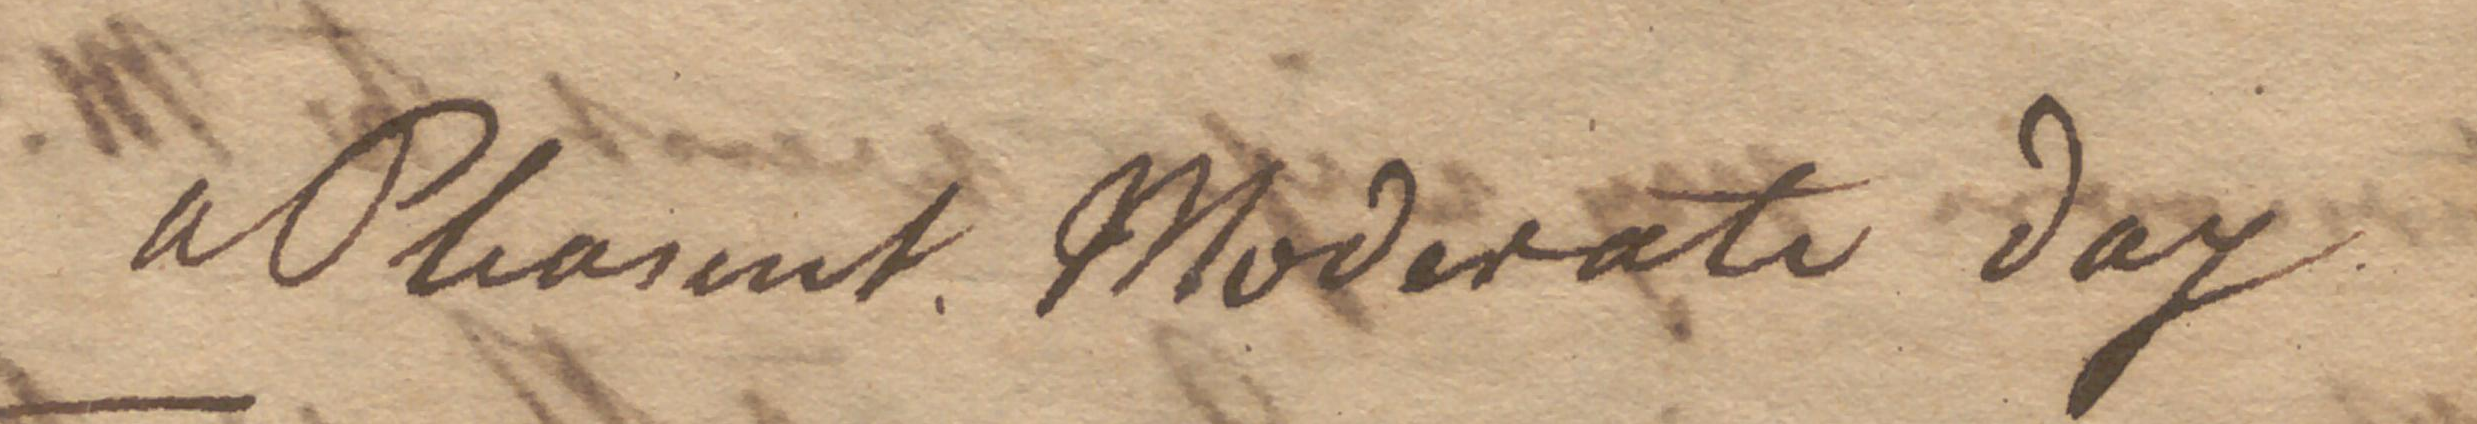a Pleasent Moderate day
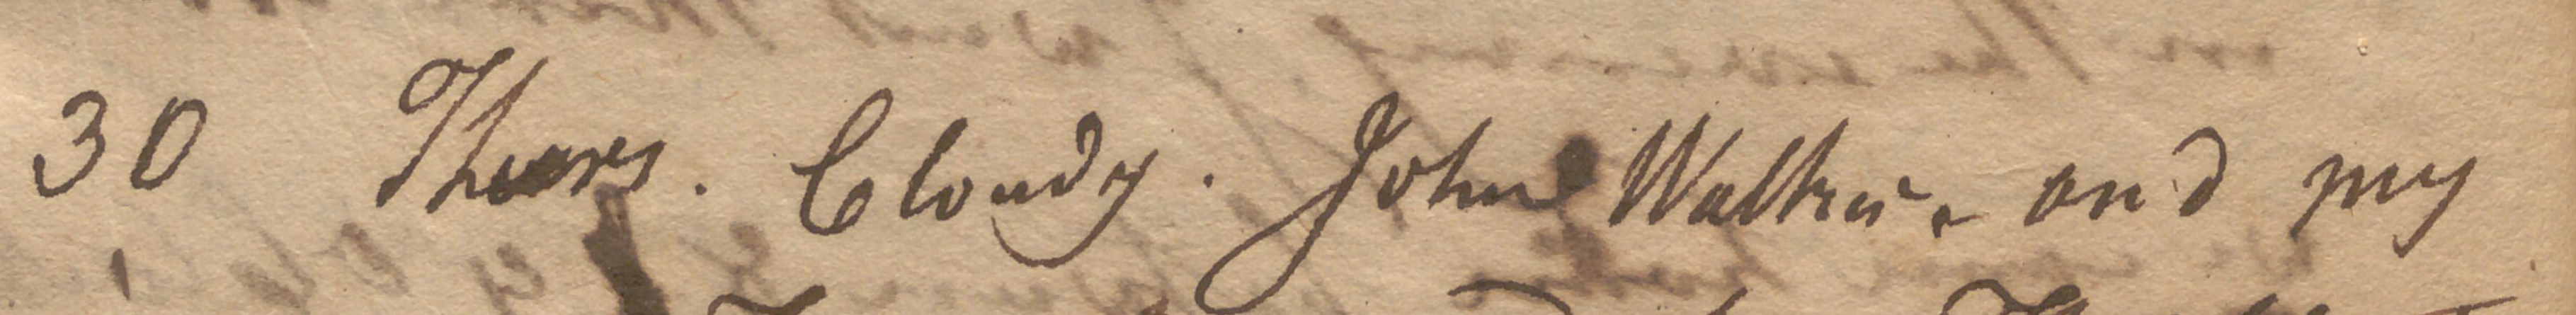30 Thurs. Cloudy. John Walker and my
